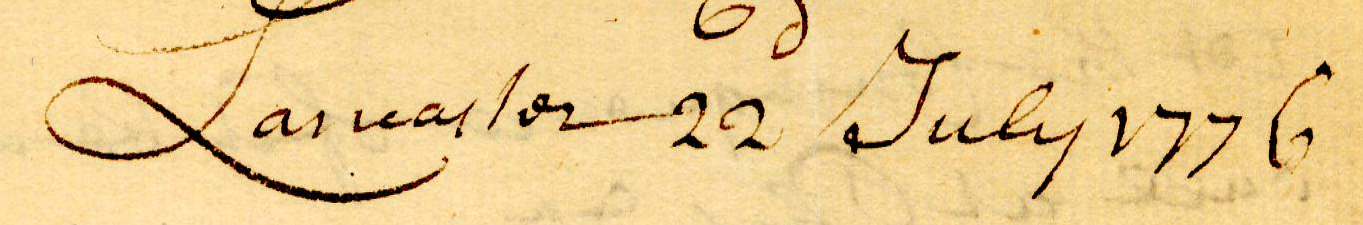Lancaster 22^d July 1776
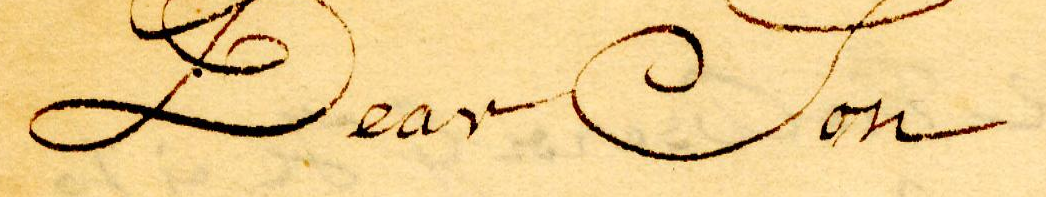Dear Son
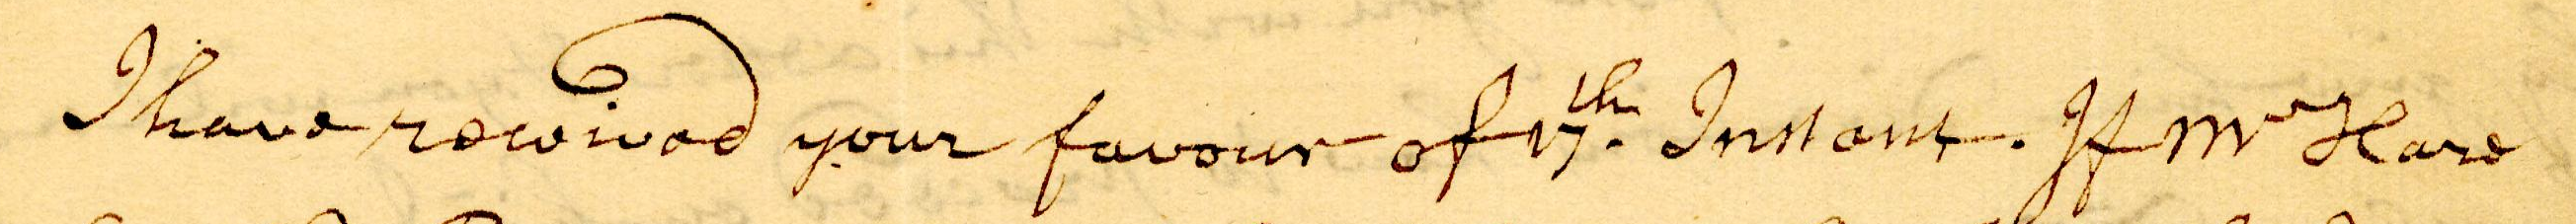I have received your favour of 17.^th Instant. If M^r Hare
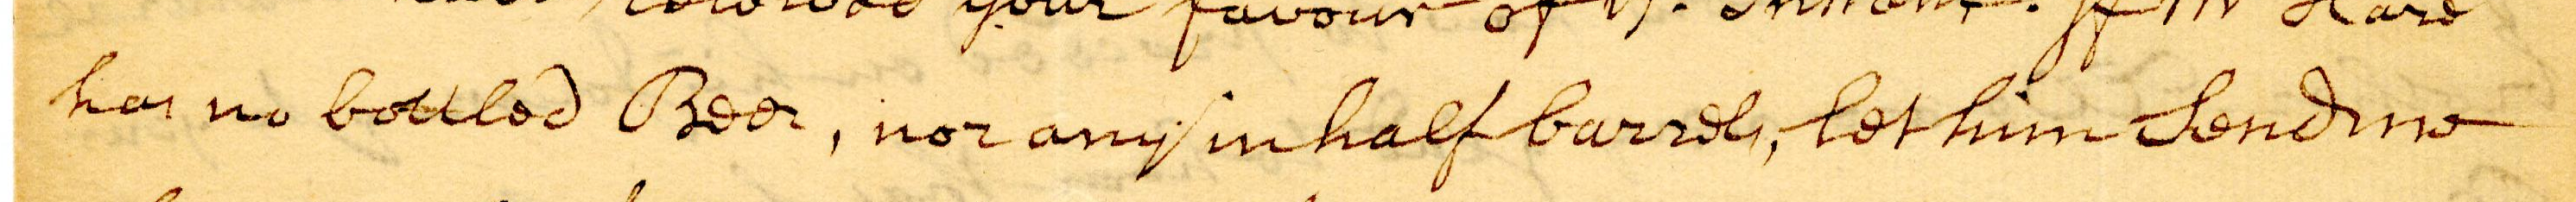has no bottled Beer, nor any in half barrels, let him send me
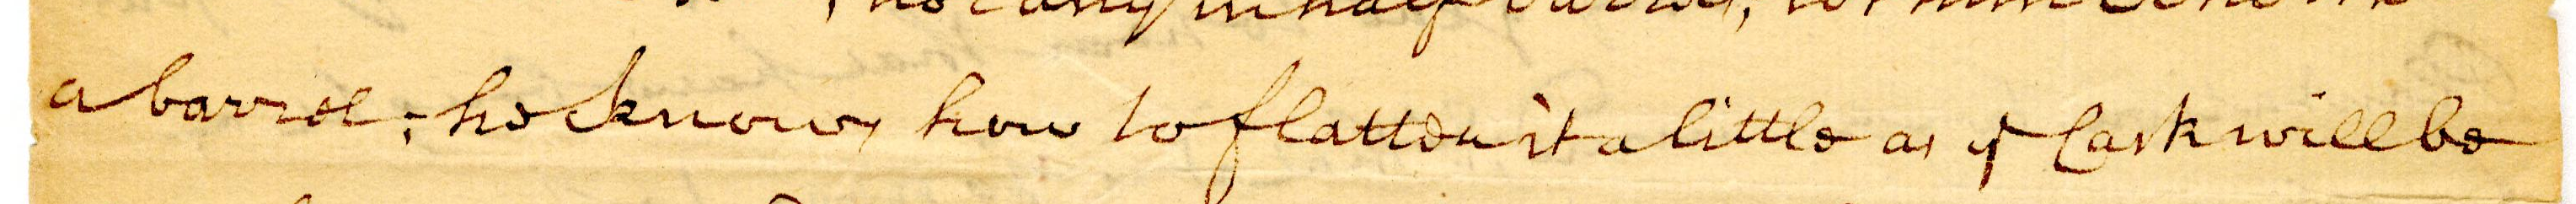a barrel; he knows how to flatten it a little as y^e Cask will be
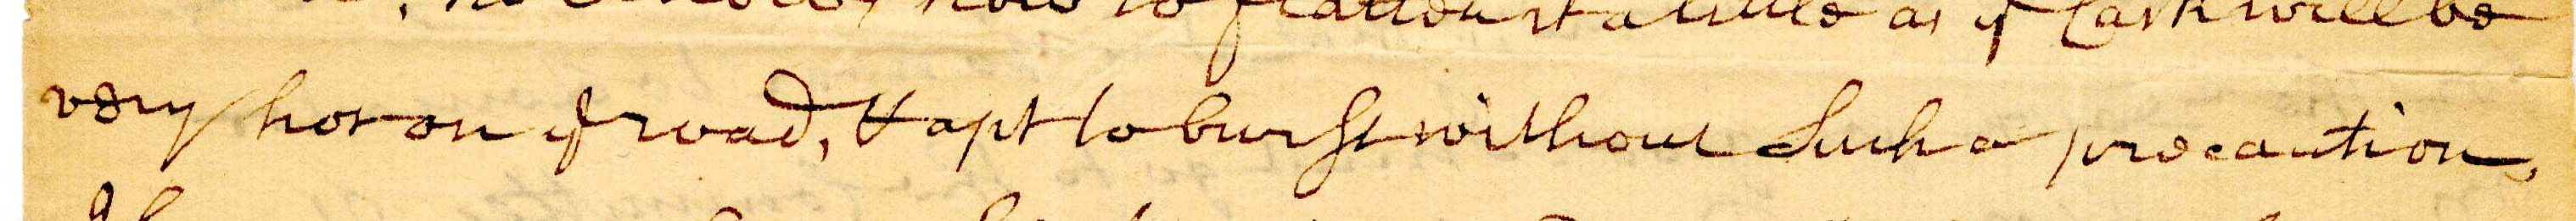very hot on y^e road, & apt to burst without such a provocation
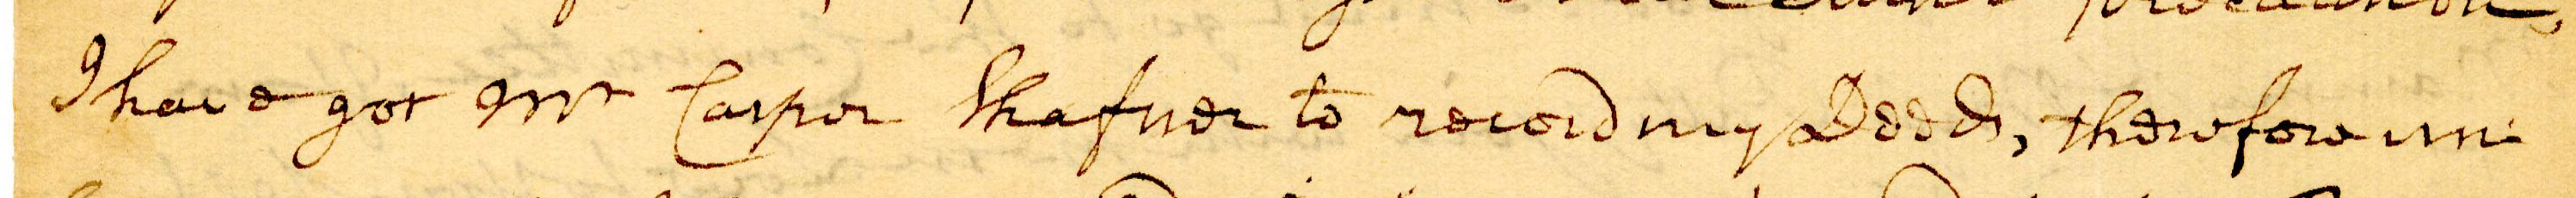I have got M^r Casper Shafner to record my Deed; therefore un
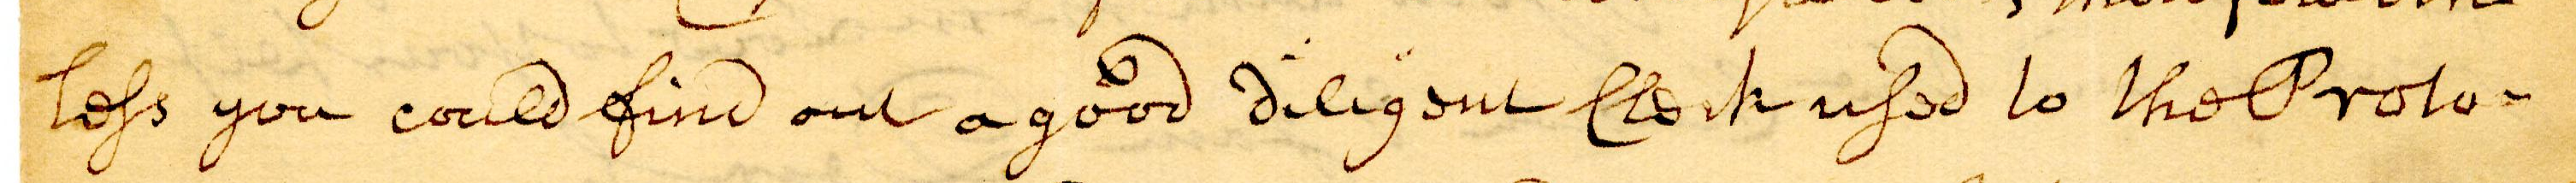less you could find out a good diligent Clerk used to the Proto-
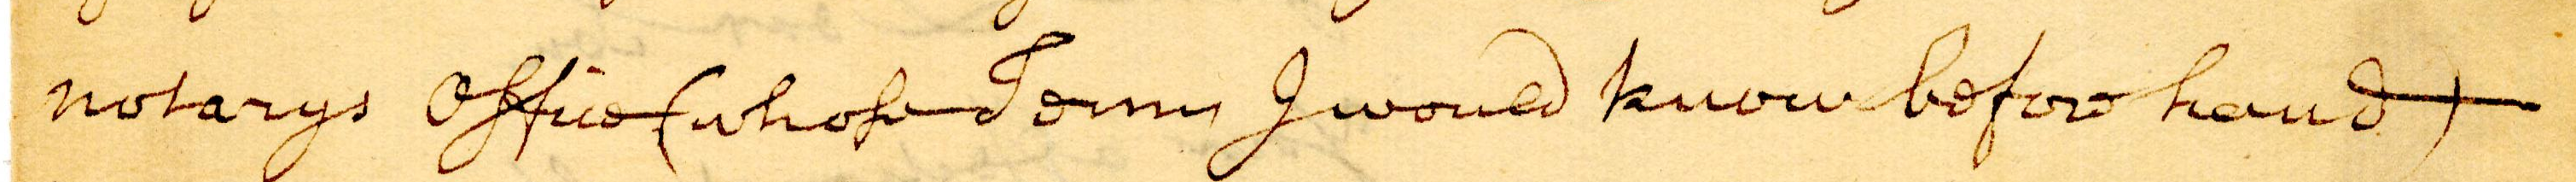notarys Office (whose Terms I would know before hand)
